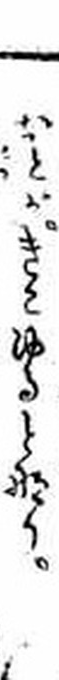おとがきこゆるとなり
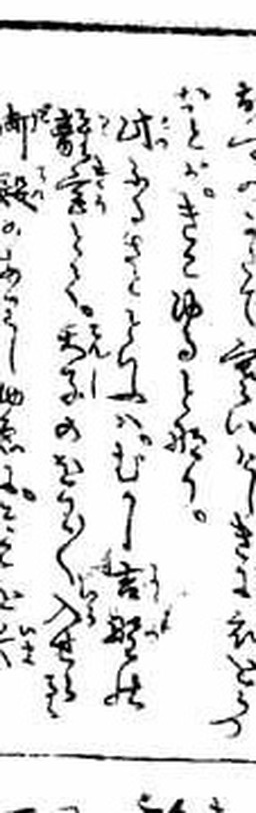此のふるさとといふは吉野の隆
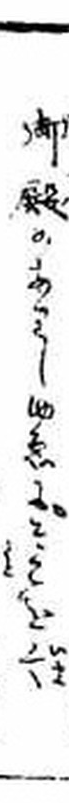御殿のありしゆゑにそこを今経
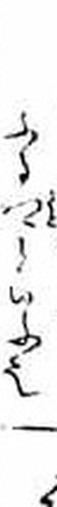ふる里といふ也
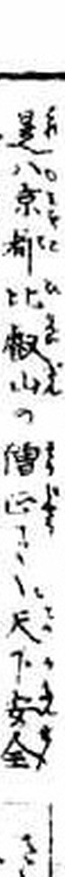是は京都比叡山の僧正にて天下安全
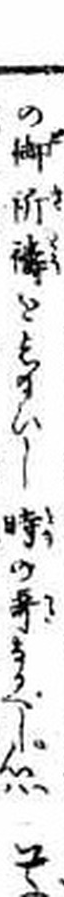の御祈祷をし給ひし時の哥なるべし心は前大
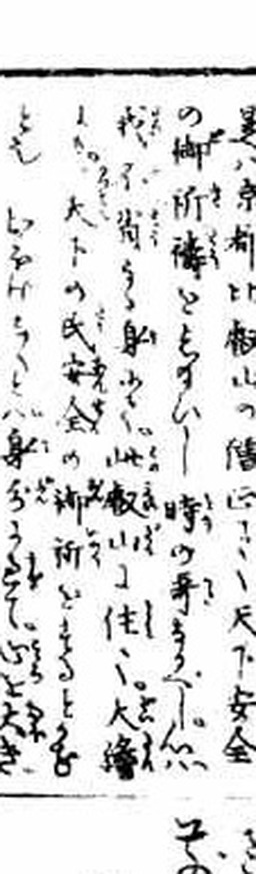我不肖なる身にて比叡山に住て大澹
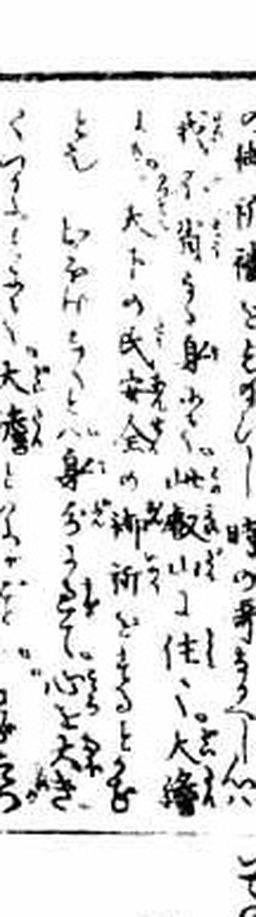より天下の氏安全の御祈をするとかな僧正
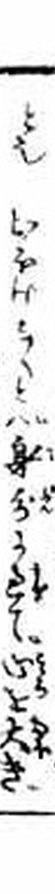と也おほけなくとは身分に過て心大き
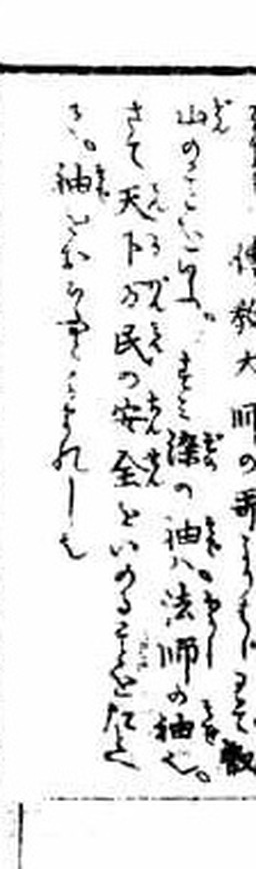さて天下万民の安全をいのることをたとへ

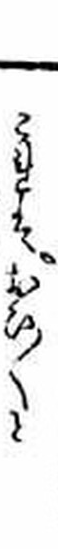これそおひ〳〵と
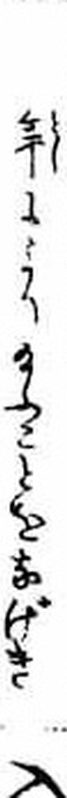年にとり給ふことをなげきて入道
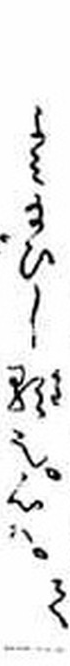よみ給ひし歌也心は前
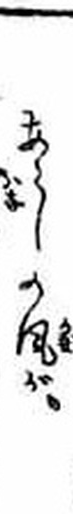あらしの風が
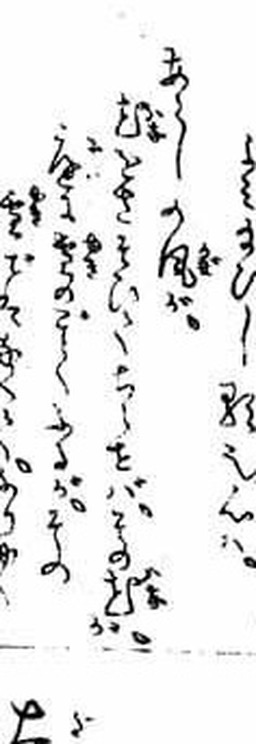花をさそひてちらすをばその花が
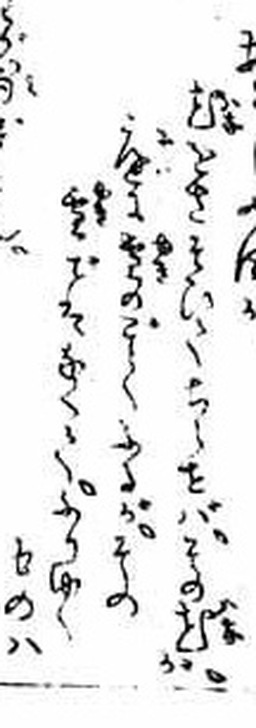庭に雪のごとくふるがその太
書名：小倉百人一首
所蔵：東京学芸大学教育コンテンツアーカイブ
